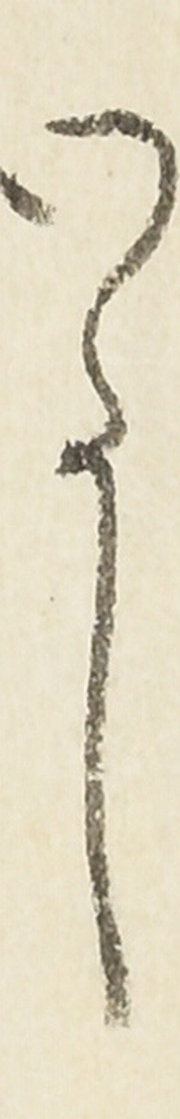わたし

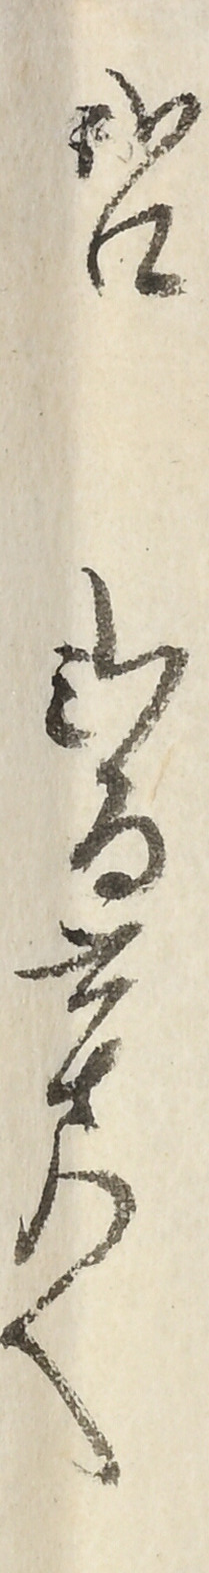弐口弐百六十八文
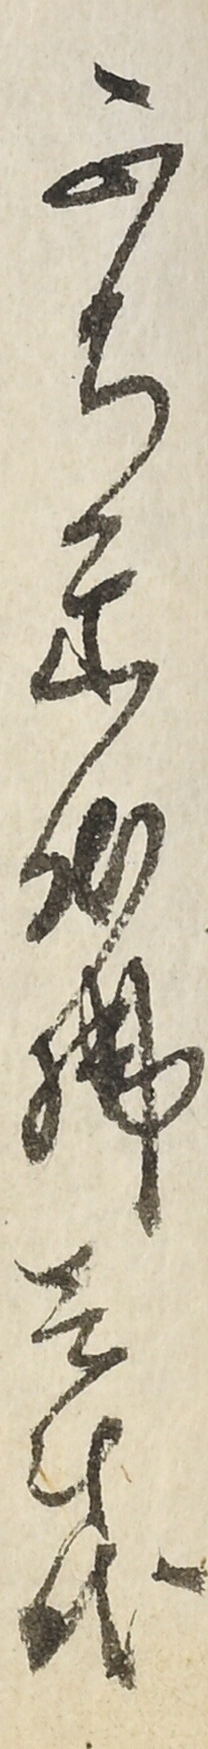ふち米作払壱斗代
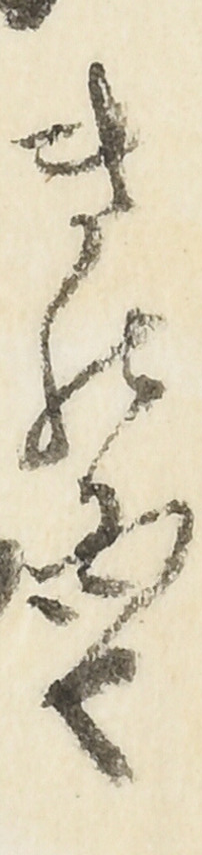きの国や
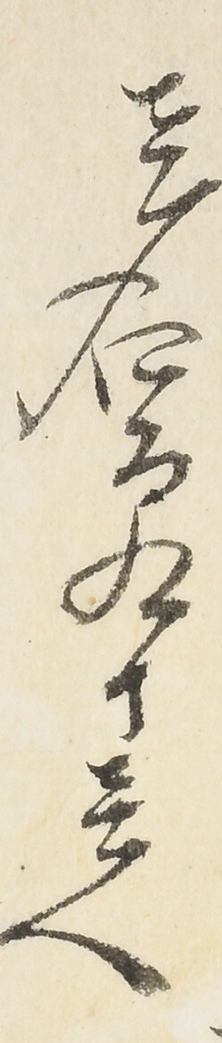壱貫四百九十壱文
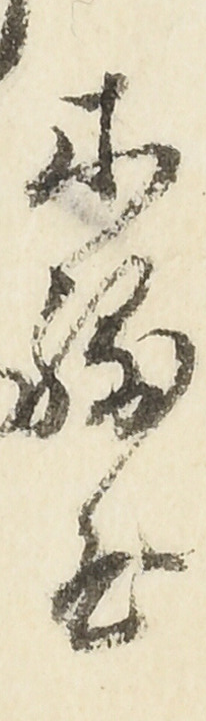木綿屋
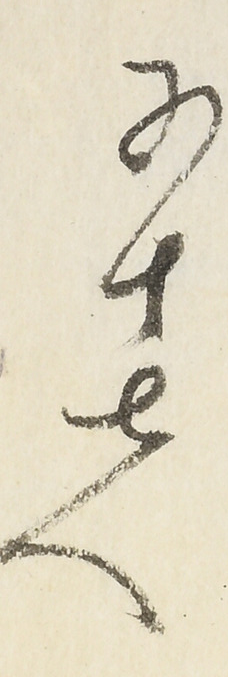五十七文
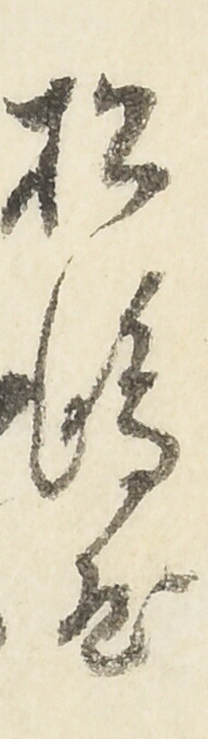松嶋屋

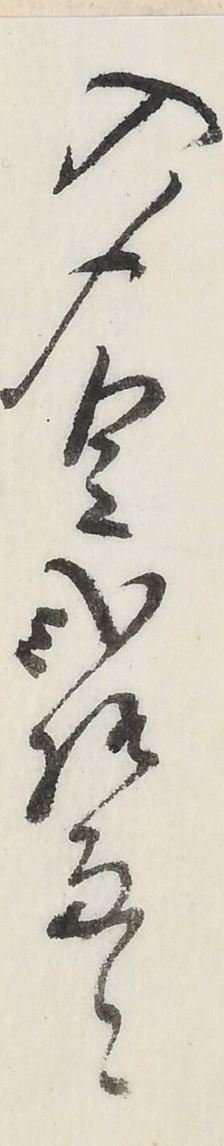入〆金弐拾両と
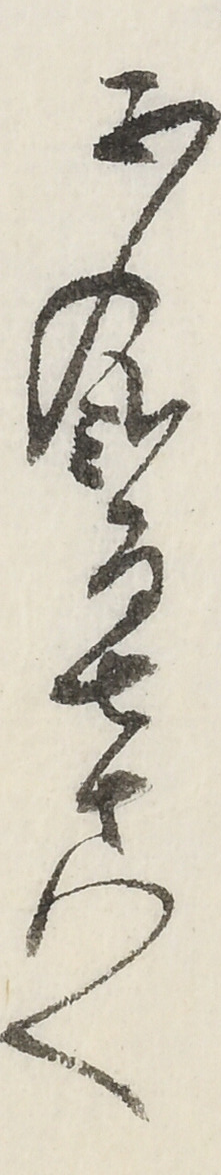五貫弐百七十八文
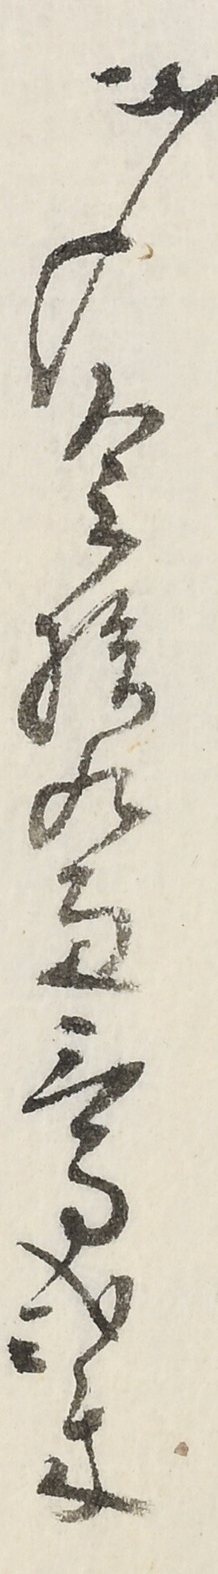出〆金拾九両三分弐朱
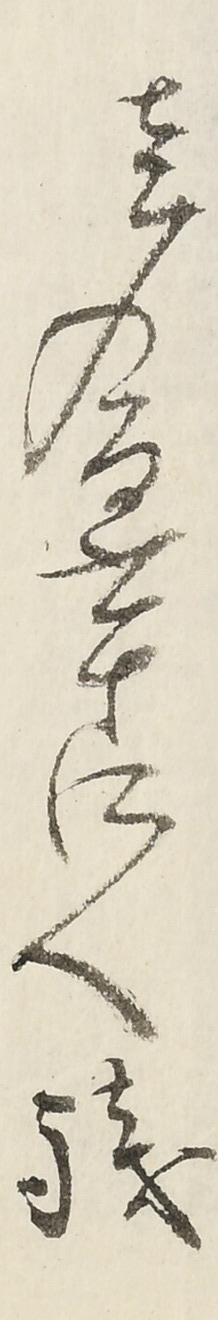壱貫百六十四文残
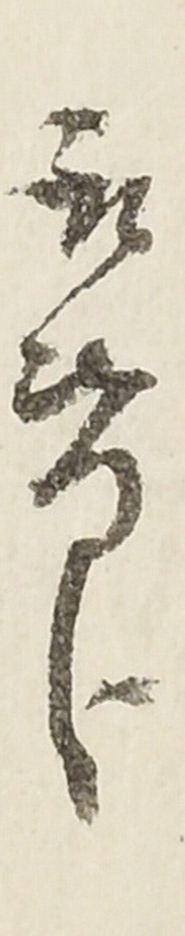取替分
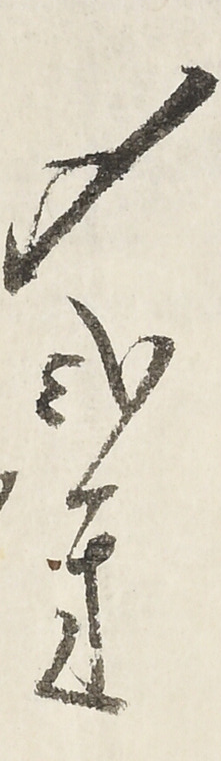〆弐朱
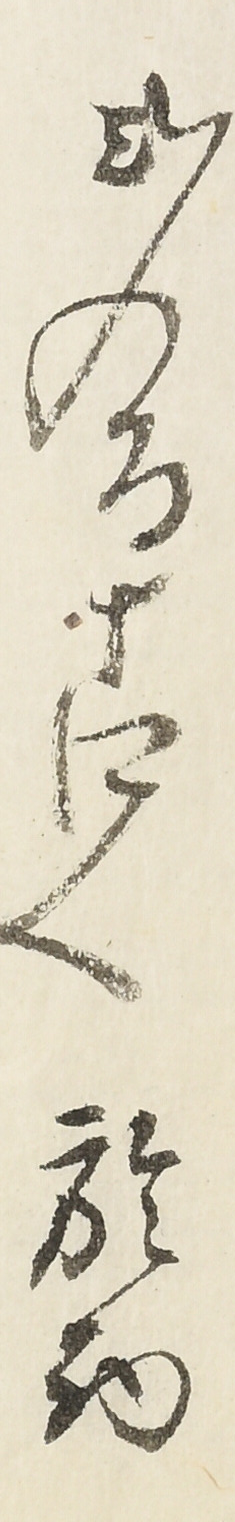弐貫百十四文於物
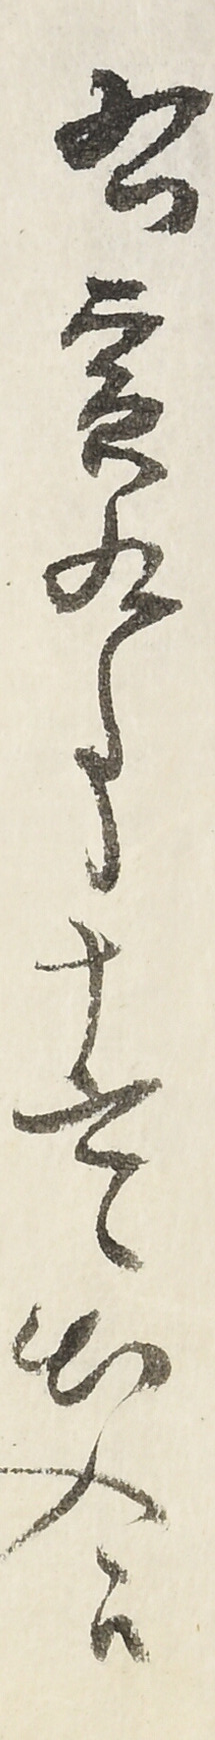右寅九月十六日出入え
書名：町方木戸御普請諸事附（一括）
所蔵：伊那市立高遠町図書館・合同会社AMANE
